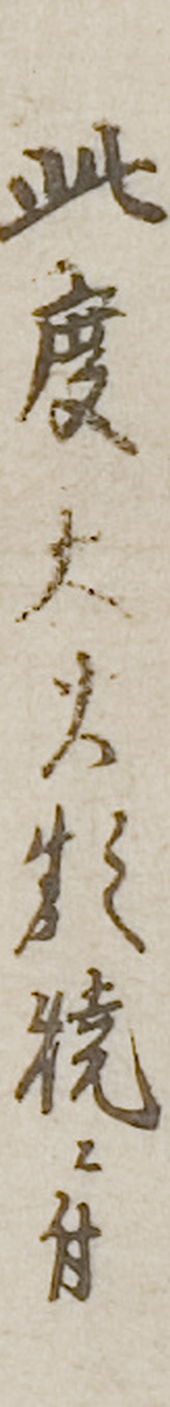此度大火類焼ニ付
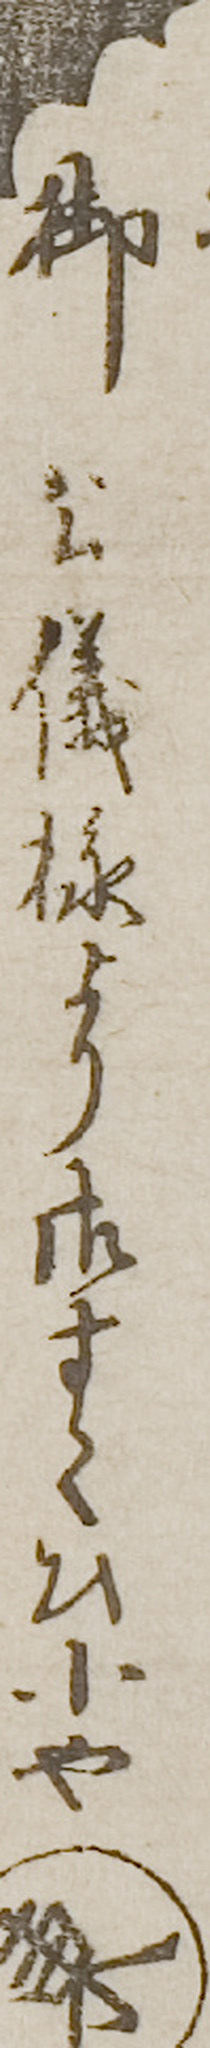御公儀様より御すくひ小や
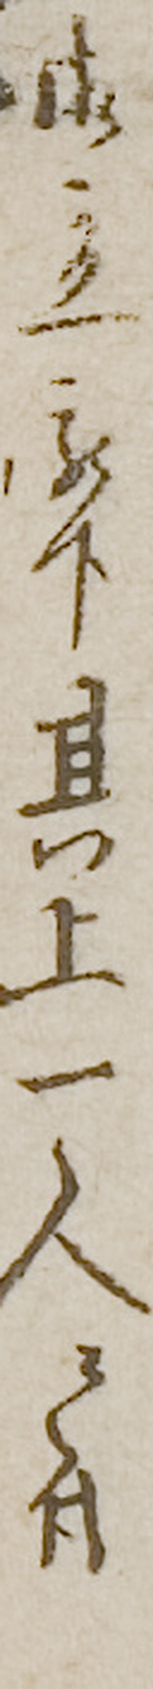御立被下其上一人ニ付
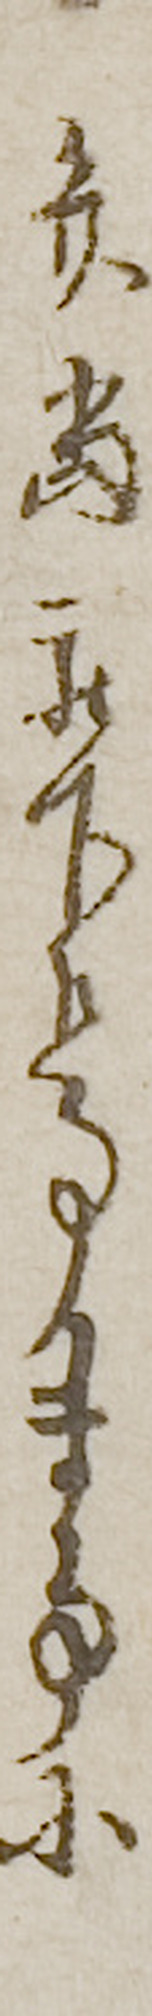弁当被下候事ま事に
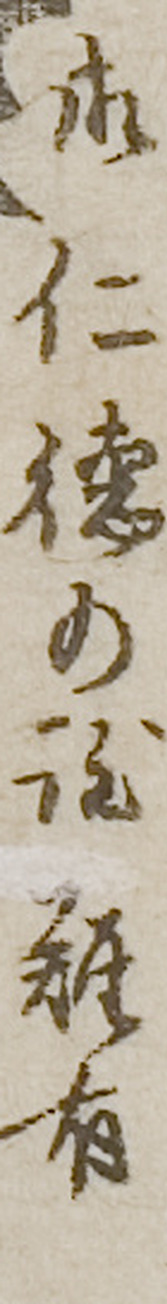御仁徳の程難有
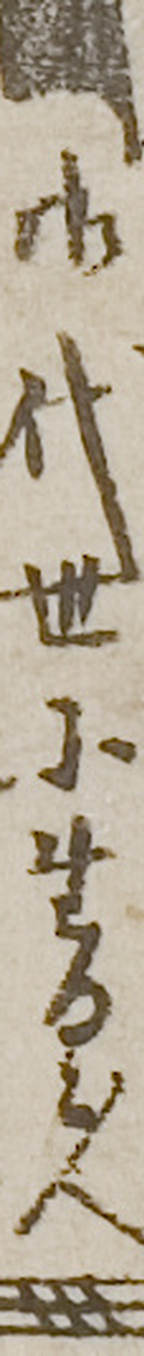御代世に生るゝ人
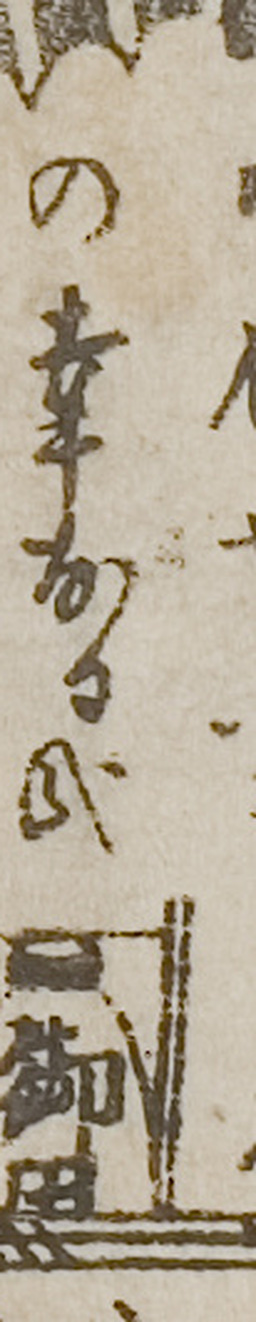の幸なる哉
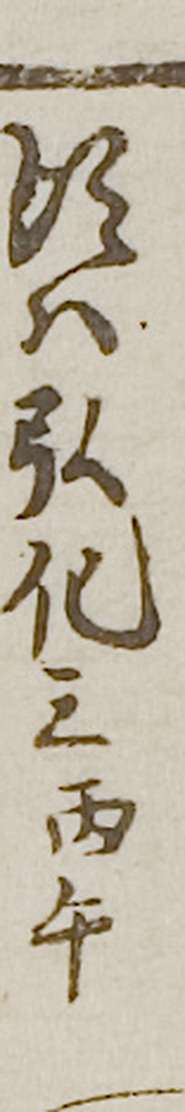頃は弘化三丙午
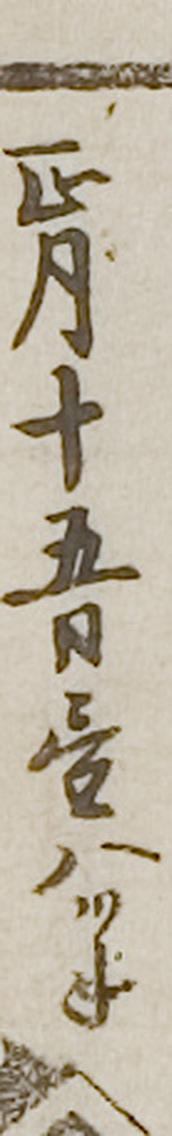正月十五日昼八ツ半
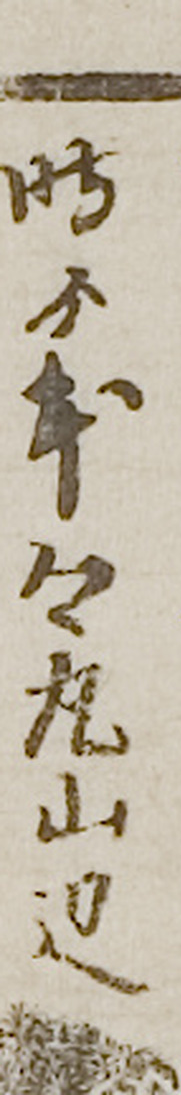時ゟ本郷丸山辺
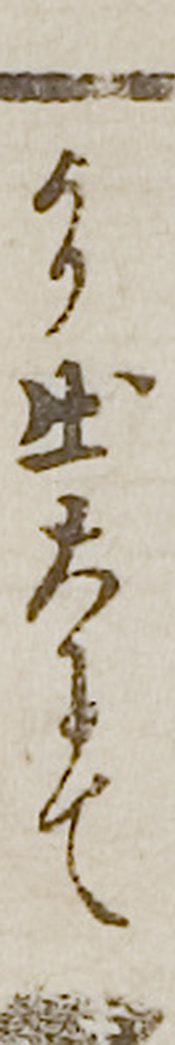より出火にて
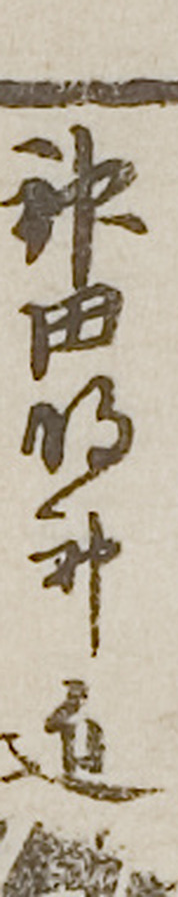神田明神近
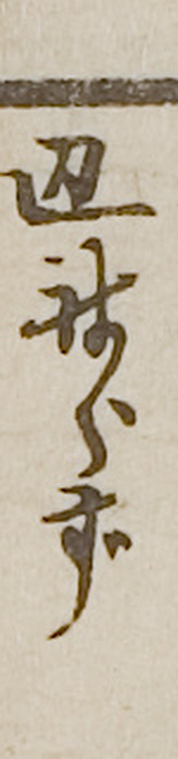辺残らず
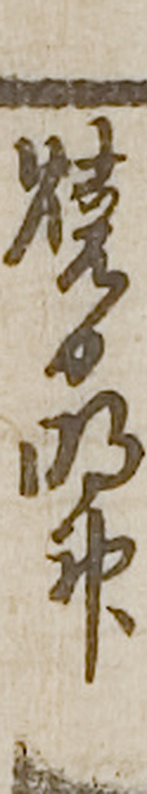焼る明神
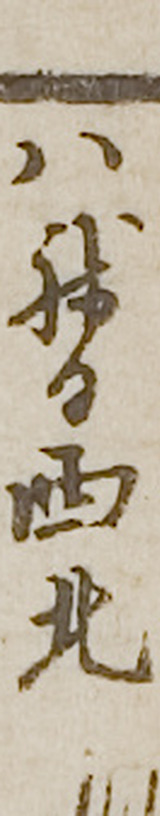は残る西北
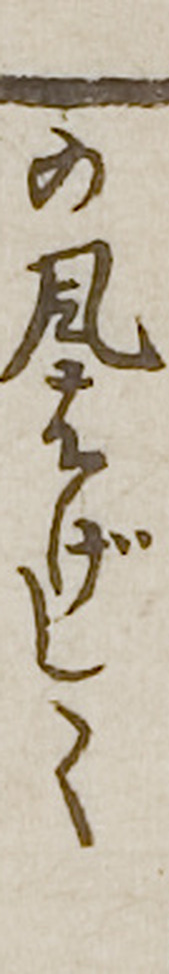の風はげしく
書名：[弘化三丙午正月十五日大火類焼図]
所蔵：東京大学総合図書館 General Library in the University of Tokyo, JAPAN
